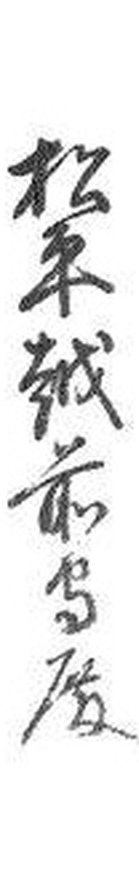松平越前守殿
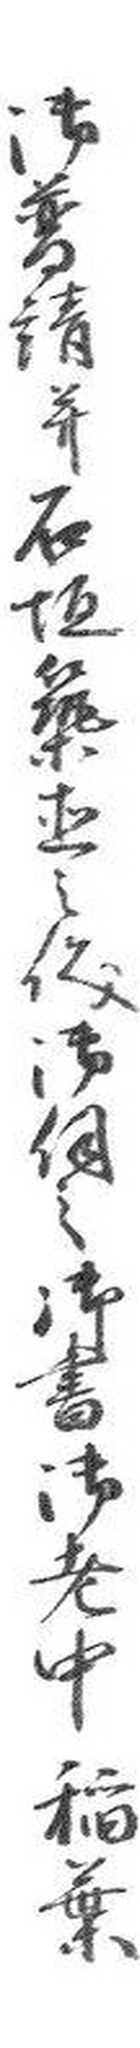御普請并石垣築直之儀御伺之御書御老中稲葉
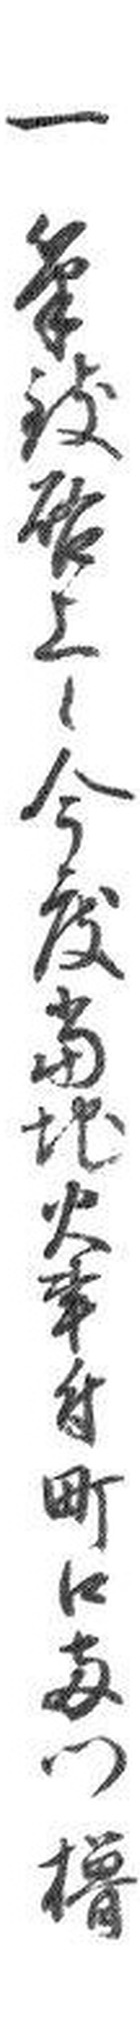一筆致啓上候今度当地火事付町口両門櫓
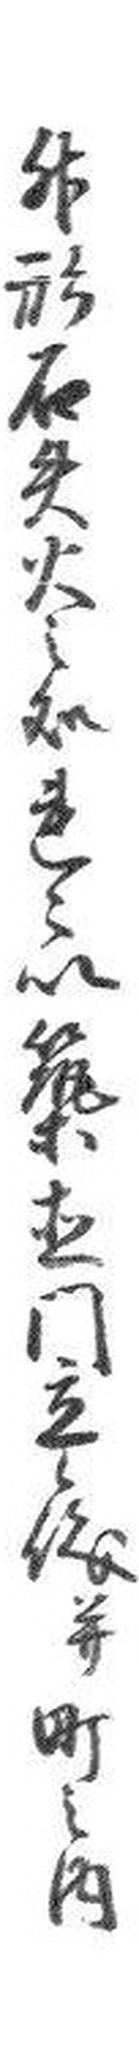升形石失火之処連々以築直門立候儀并町之内
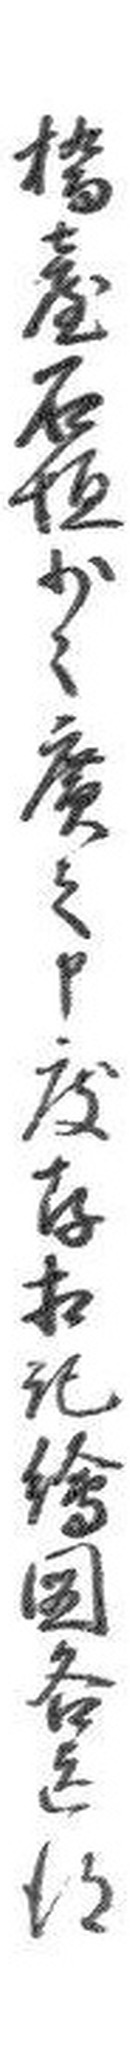橋台石垣少々広之申度存相記絵図各迄得
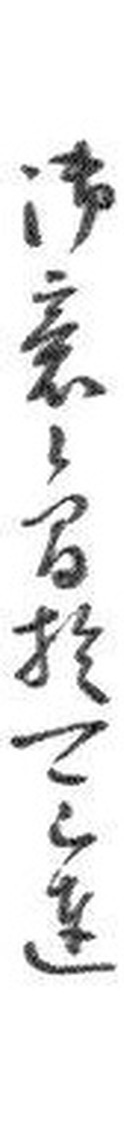御意候間於可被達
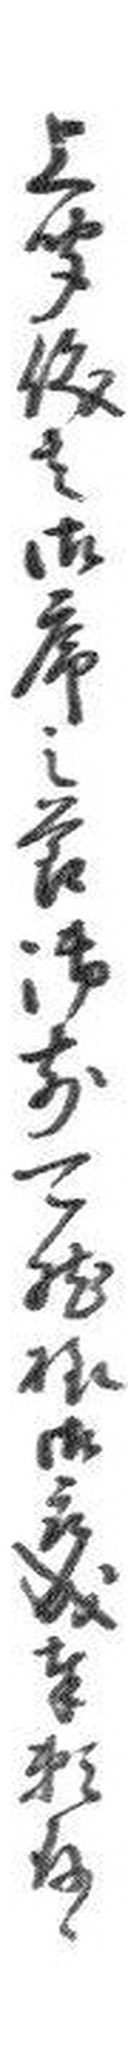上聞儀者御序之節御前可然様御取成奉頼存候
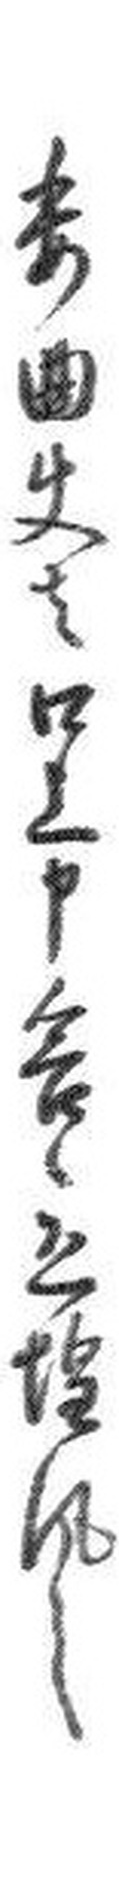委曲使者口上申含候恐惶謹言
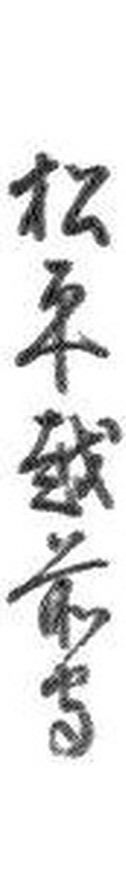松平越前守
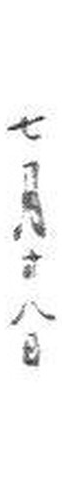七月廿八日
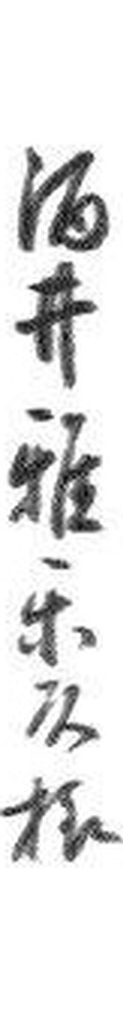酒井雅楽頭様
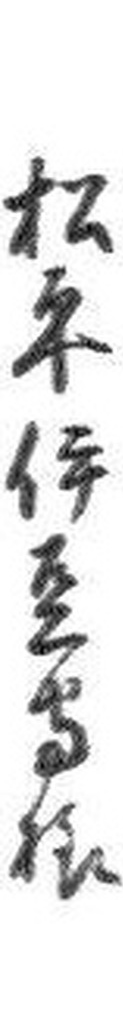松平伊豆守様
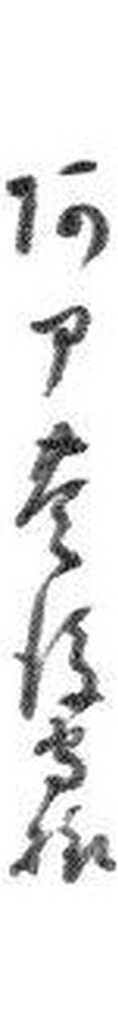阿部豊後守様
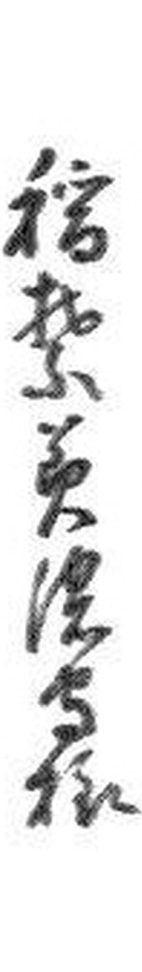稲葉美濃守様
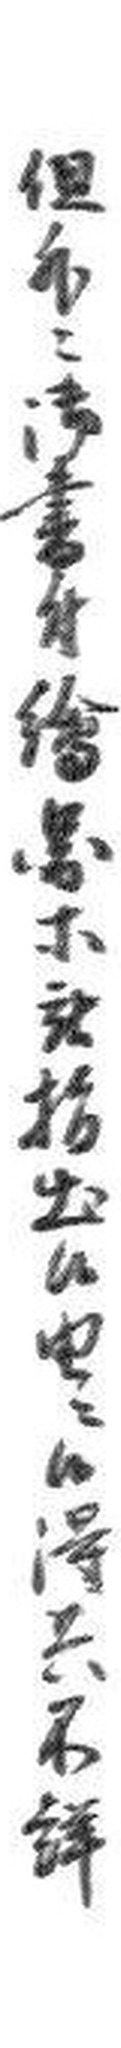但外ニ御書付絵図等被指出候由ニ候得共不詳

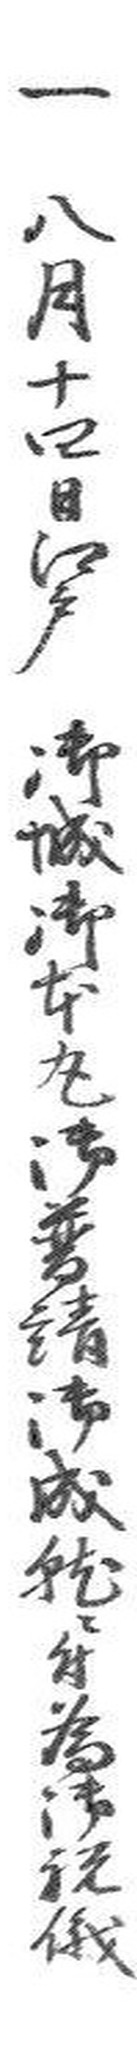一八月十四日江戸御城御本丸御普請御成就ニ付為御祝儀
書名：家譜 五 光通公 従寛永十三年到万治二年
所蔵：福井県文書館 Fukui Prefectural Archives
